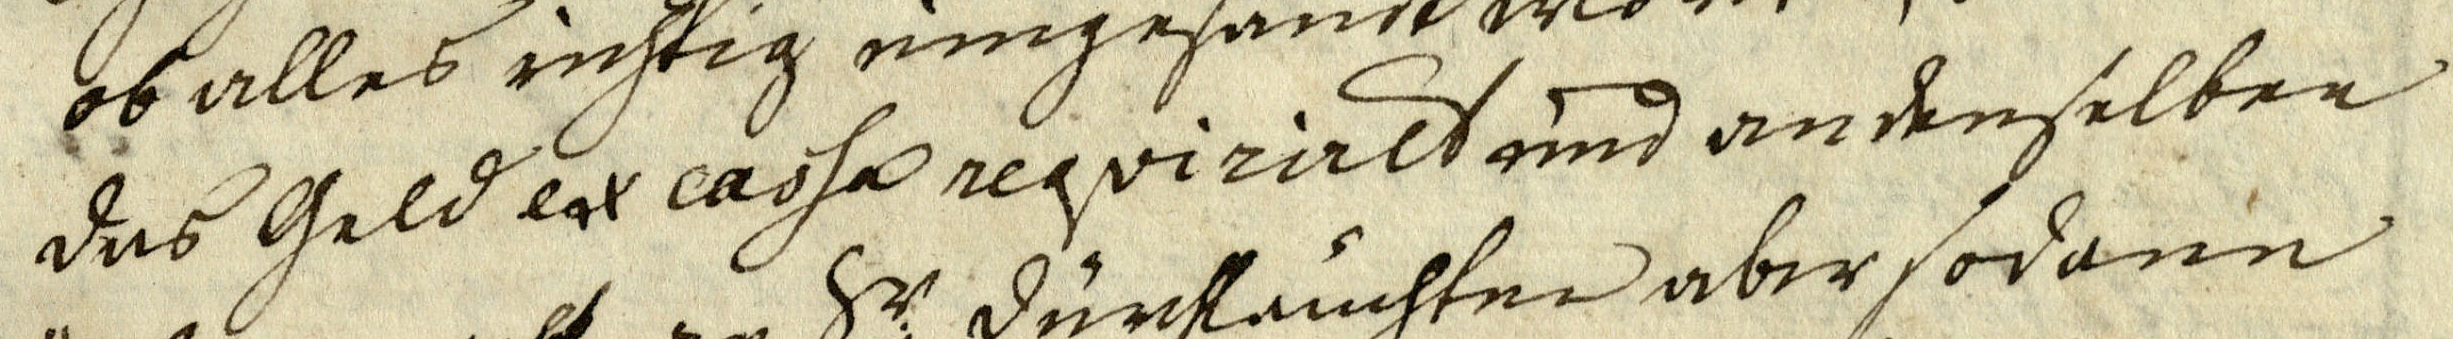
das Geld ex cassa requiriret und an denselben
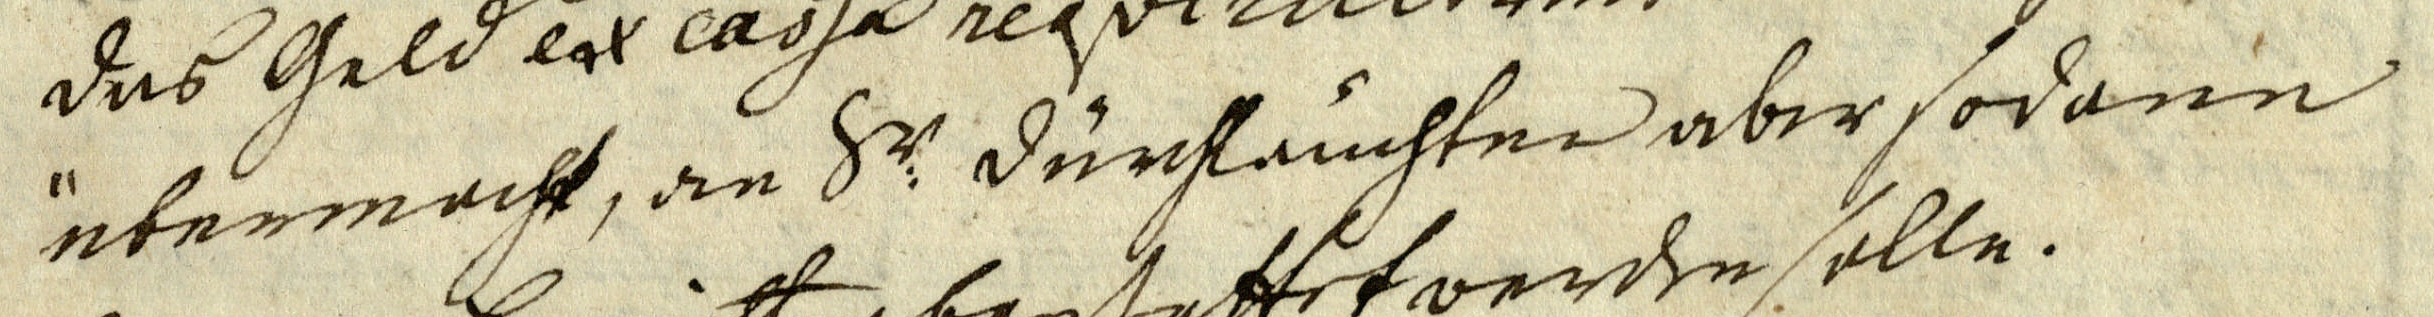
übermacht, an Sr. Durchlauchten aber sodann
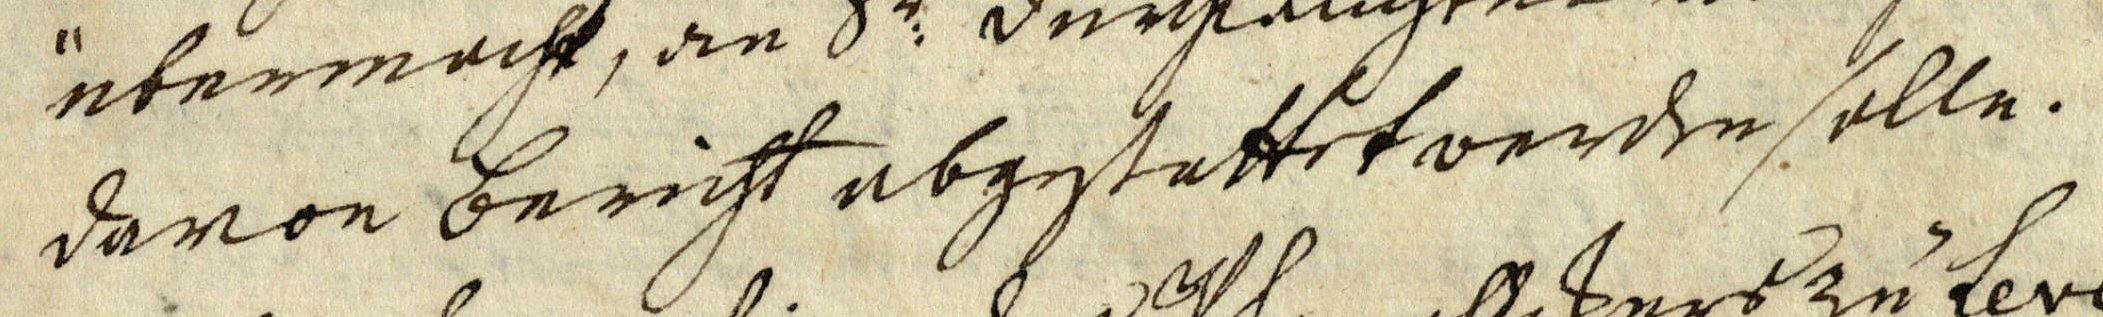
davon Bericht abgestattet werden solle.
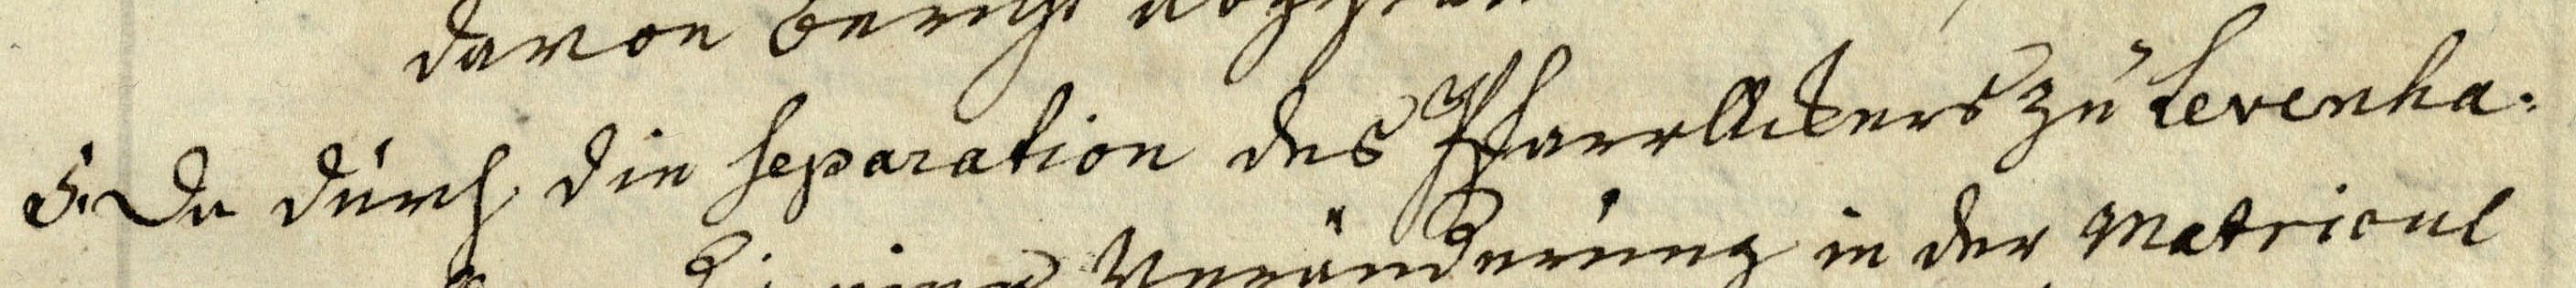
5. Da durch die Separation des PfarrAckers zu Levenha¬
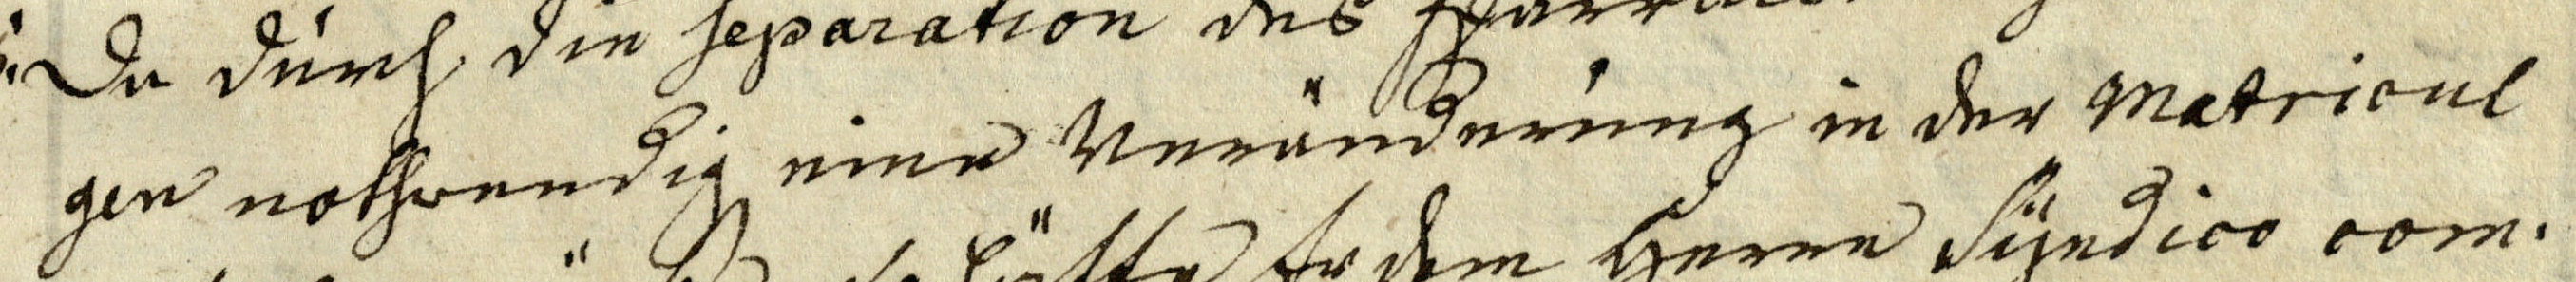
gen nothwendig eine Veränderung in der Matricul
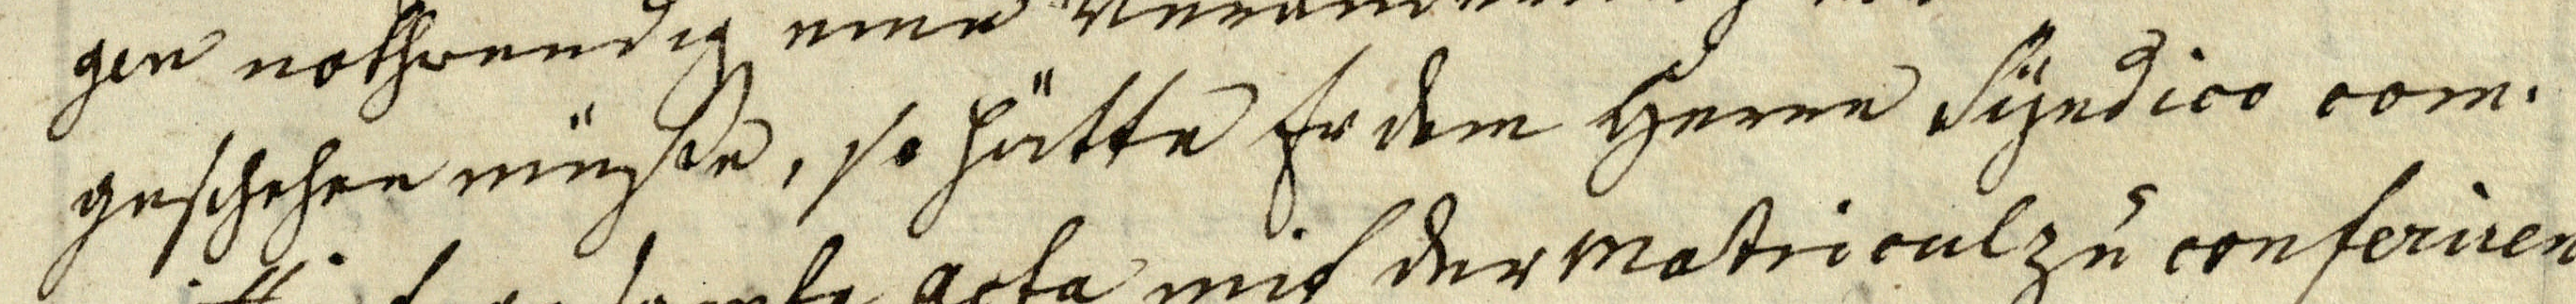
geschehen müße, so hätte Er dem Herrn Sÿndico com¬
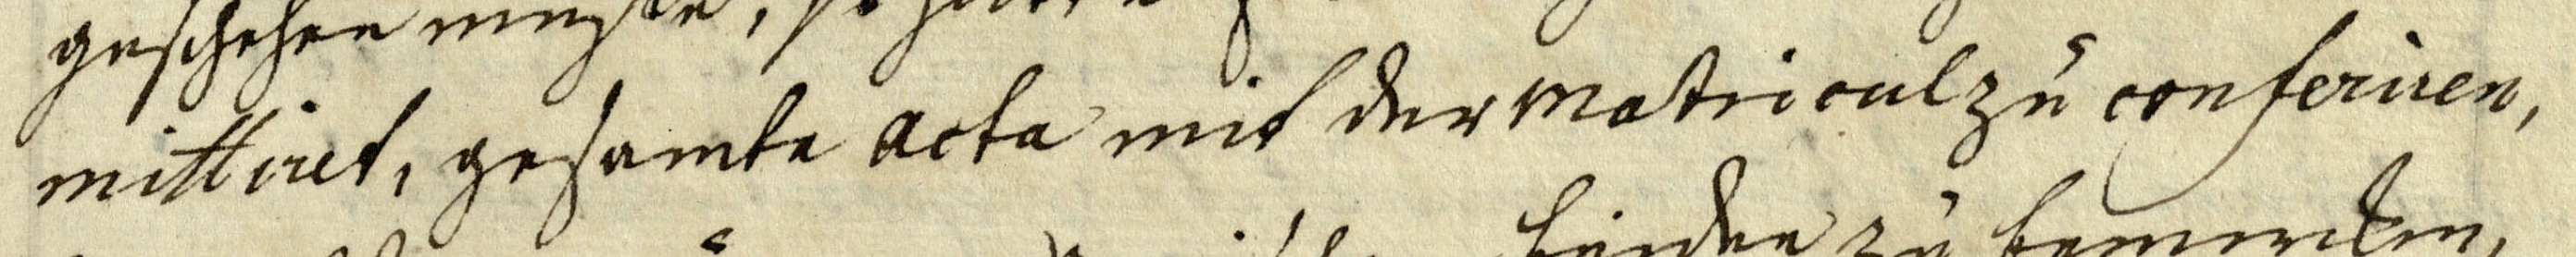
mittiret, gesamte Acta mit der Matricul zu conferiren,
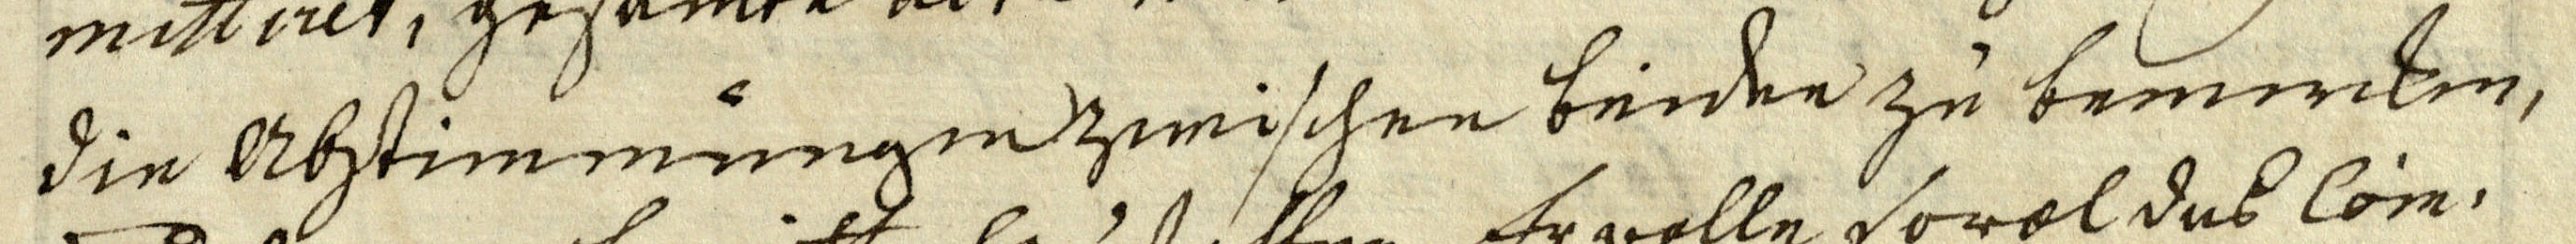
die Abstimmungen zwischen beiden zu bemercken,
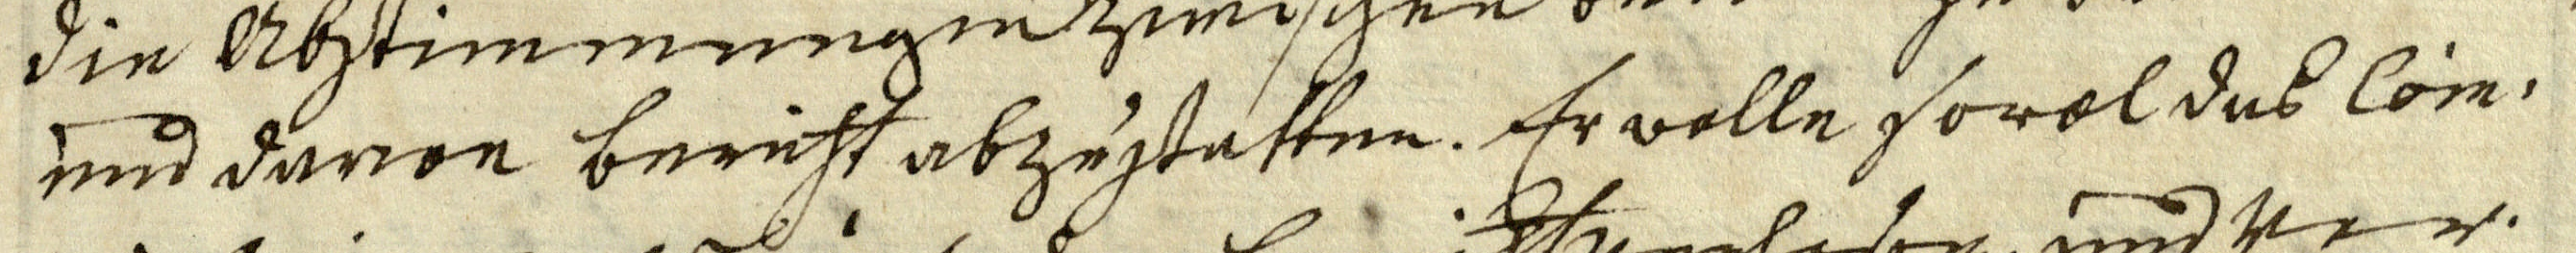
und davon Bericht abzustatten. Er wolle sowol das Com¬
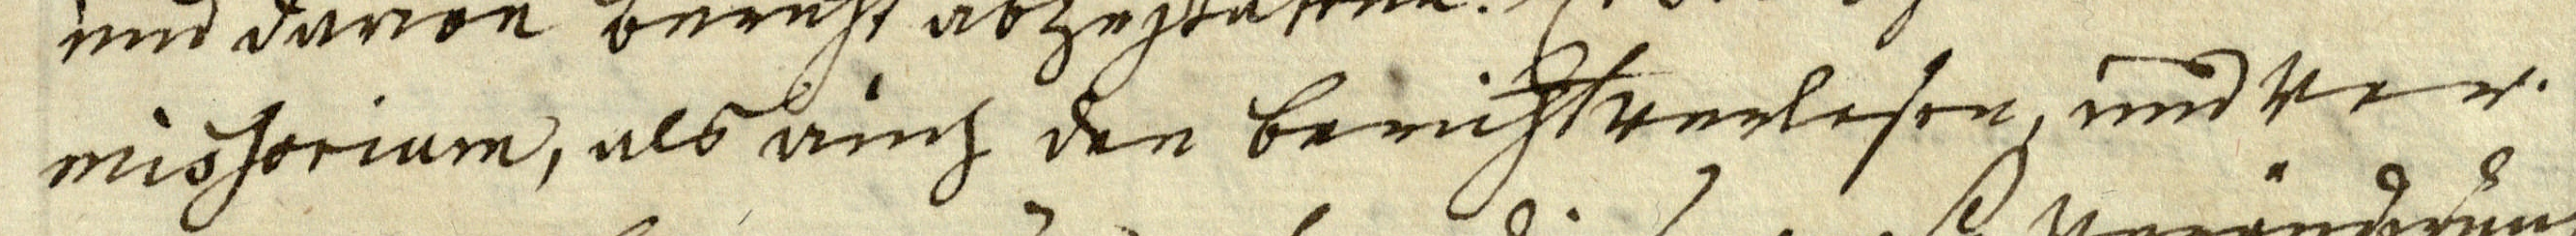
missorium, als auch den Bericht verlesen, und ver¬
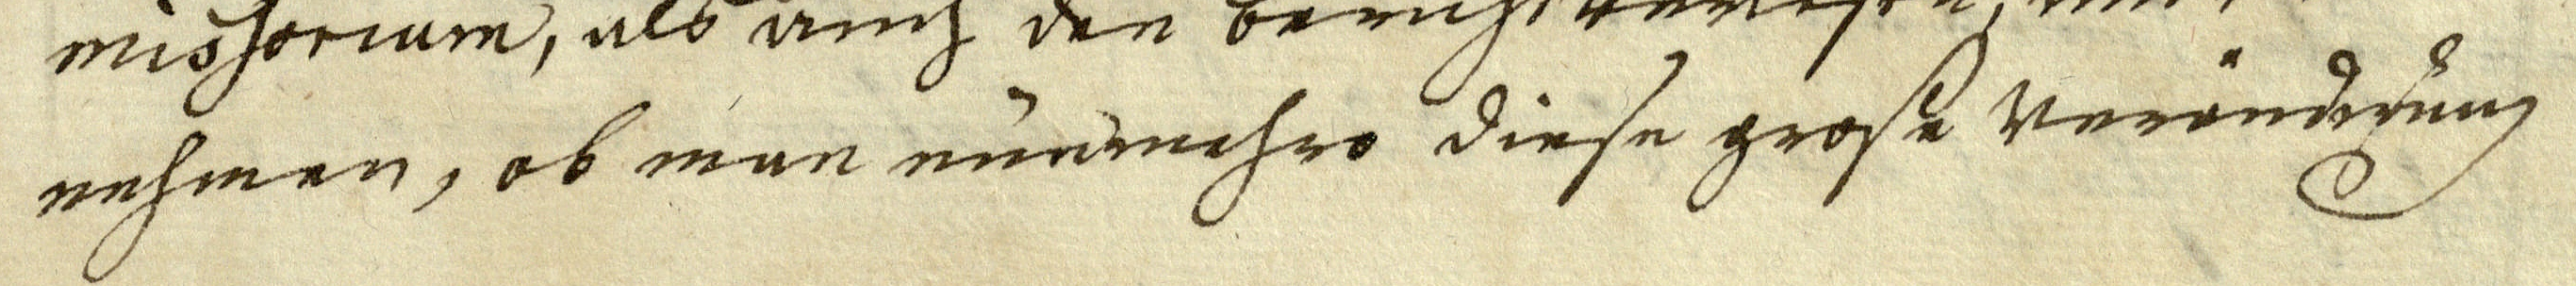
nehmen, ob man nunmehr diese große Veränderung
